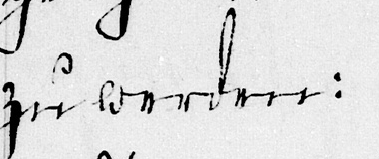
zu werden:
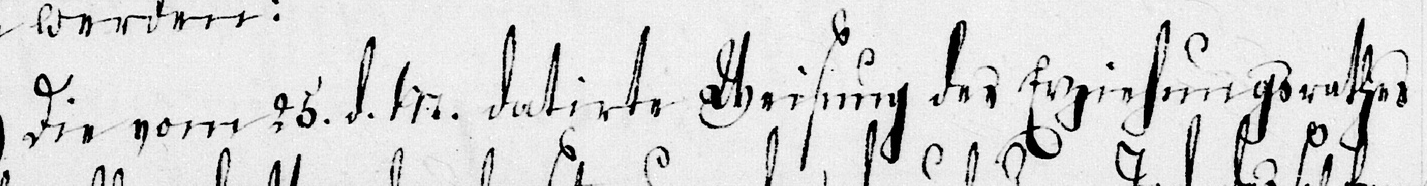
Die vom 25. d. M. datirte Weisung des Erziehungsrathes
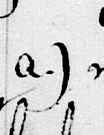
a.)
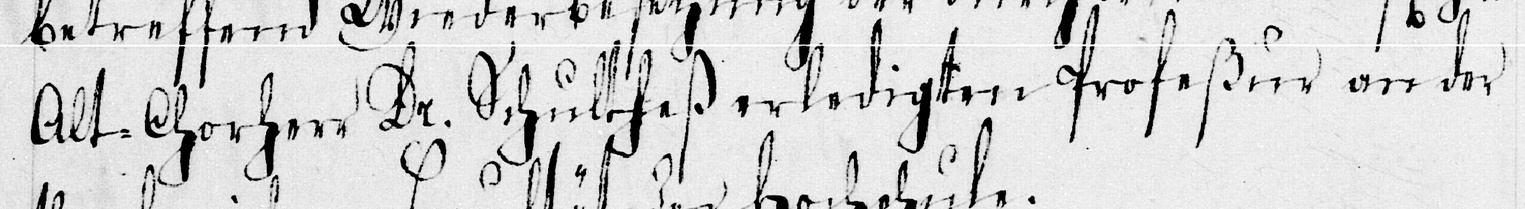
Alt-Chorherr Dr. Schultheß erledigten Profeßur an der
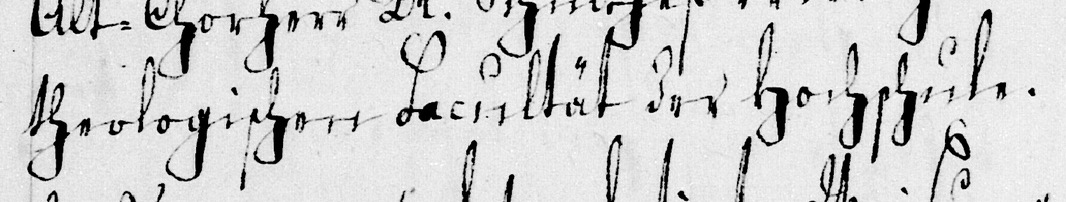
theologischen Facultät der Hochschule.
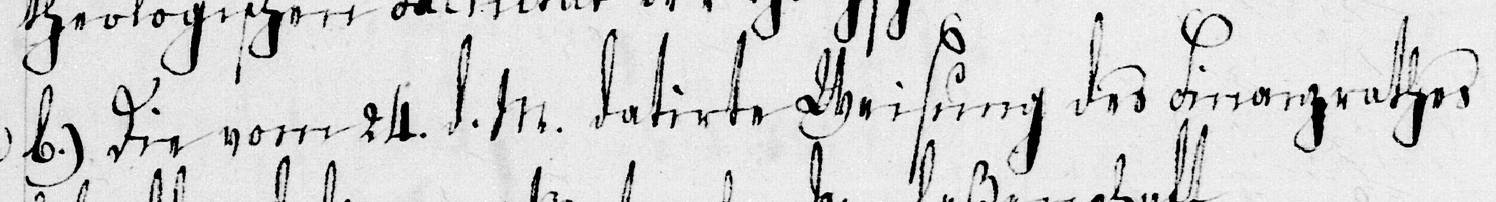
b.) Die vom 24. d. M. datirte Weisung des Finanzrathes
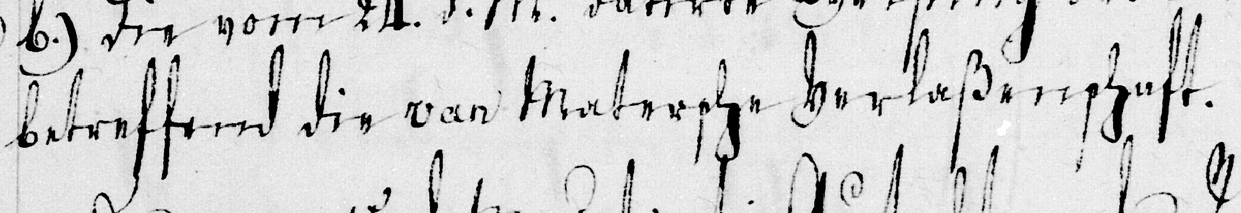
betreffend die van Matersche Verlaßenschaft.
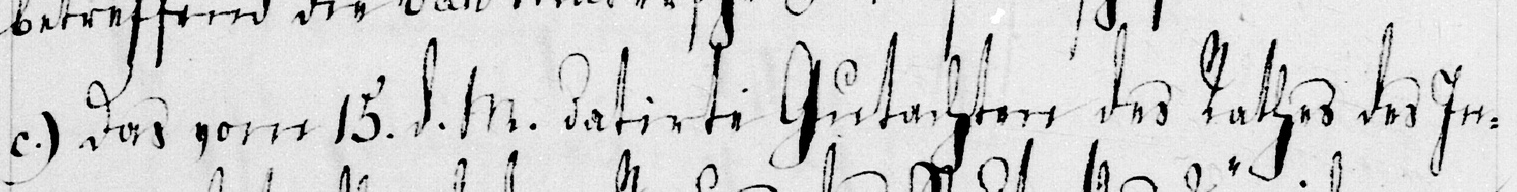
c.) Das vom 15. d. M. datirte Gutachten des Rathes des In¬
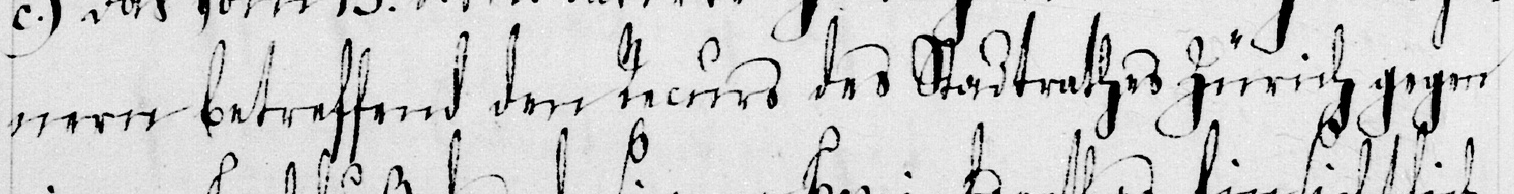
nern betreffend den Recurs des Stadtrathes Zürich gegen
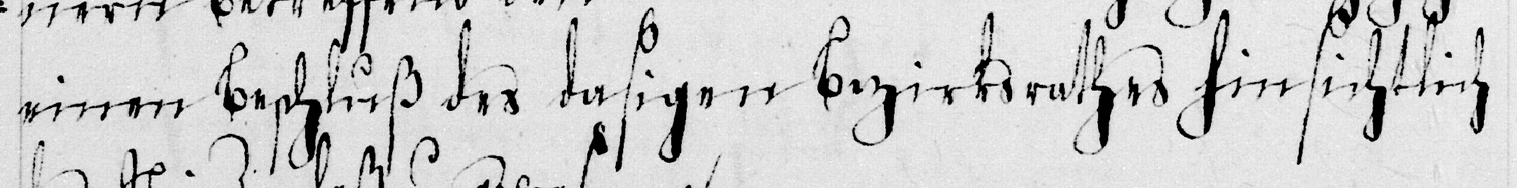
einen Beschluß des dasigen Bezirksrathes hinsichtlich
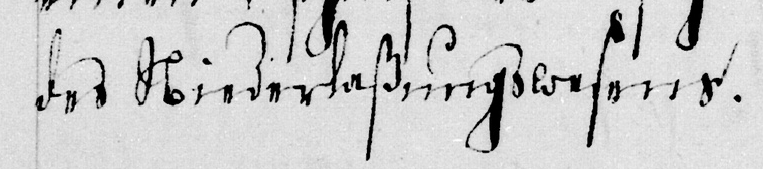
des Niederlaßungswesens.
